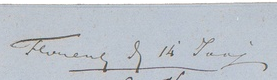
Florenz den
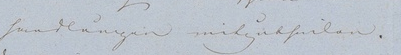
handlungen mitzutheilen.
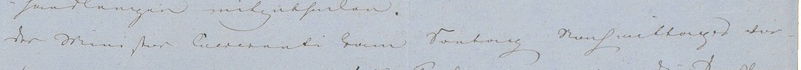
Der Minister Correnti kam Sontag Nachmittags ver-
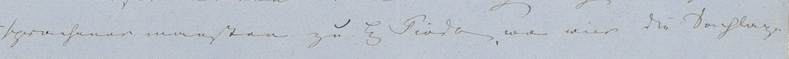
sprochener maaßen zu Herrn Pioda, wo wir die Sachlage
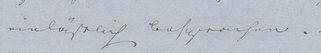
einläßlich besprachen. –
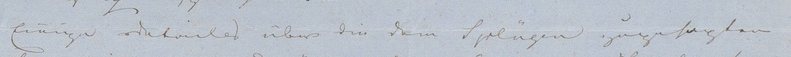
Einige Details über die dem Splügen zugesagten
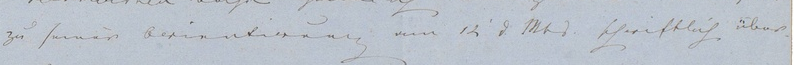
zu seiner Orientirung vom 12t d. Mts schriftlich über-
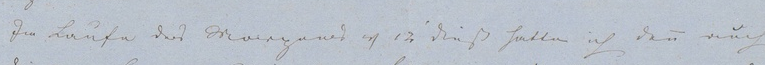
Im Laufe des Morgens vom 14t dieß hatte ich denn auch
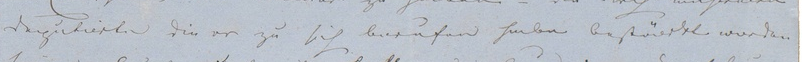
Deputirte die er zu sich berufen habe bestärkt worden
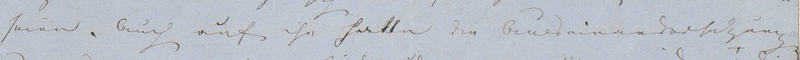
seien. Auch auf ihn hatte die Auseinandersetzung
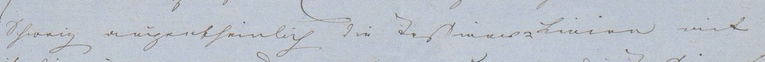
Schweiz augenscheinlich die Tessiner-Linien mit
